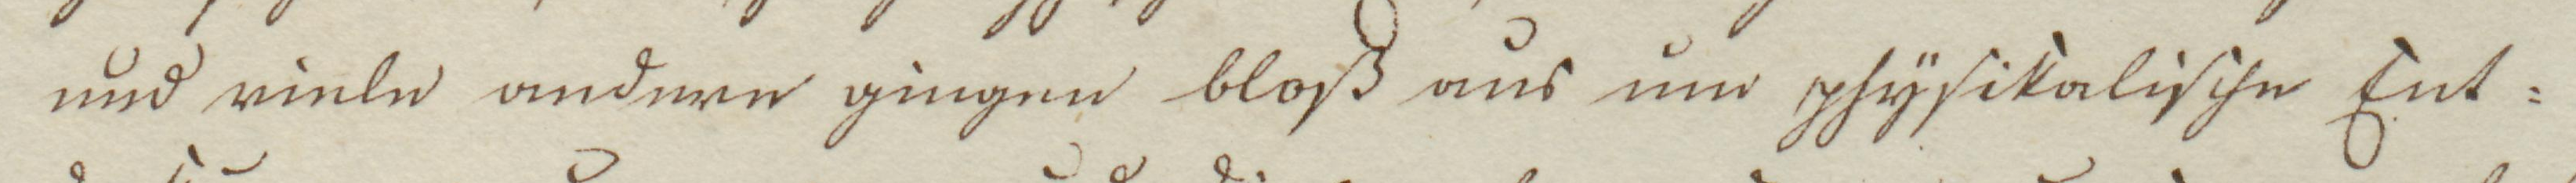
und viele andere gingen bloß aus um phÿsikalische Ent-
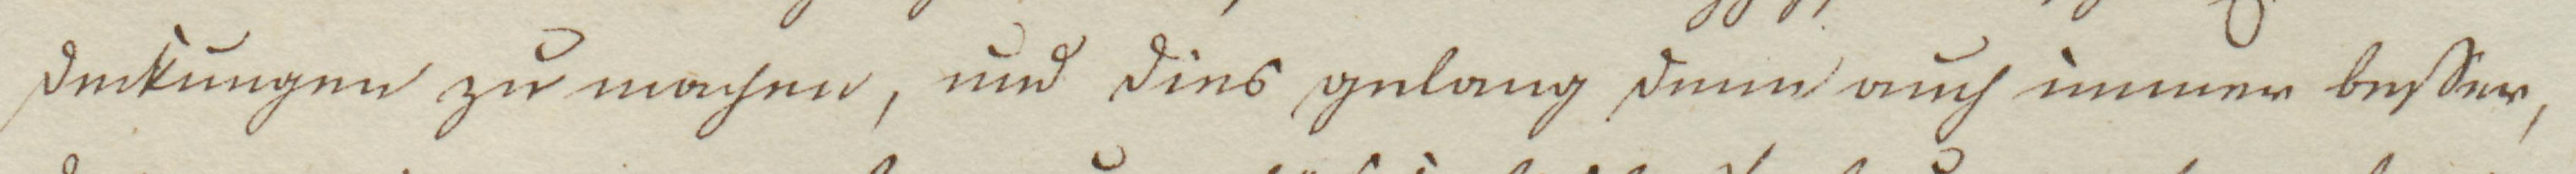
deckungen zu machen, und dies gelang denn auch immer besser,
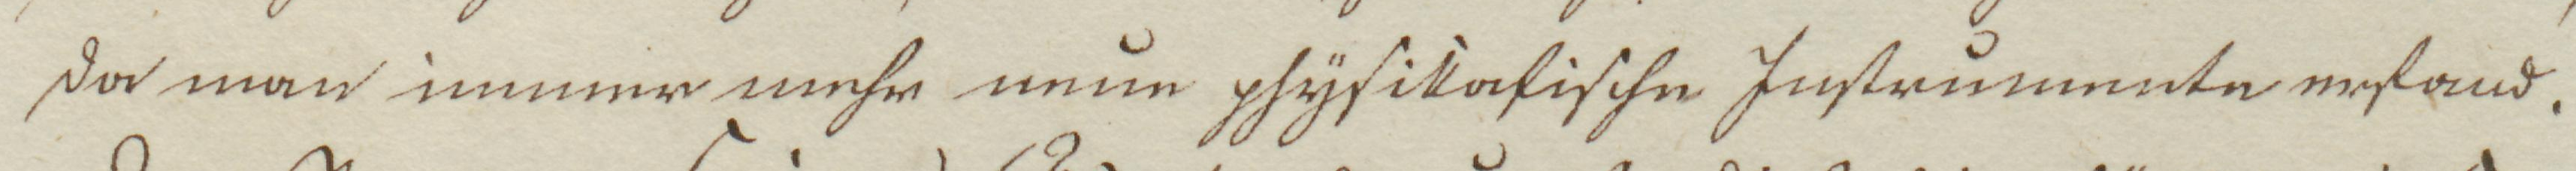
da man immer mehr neue phÿsikalische Instrumente erfand.
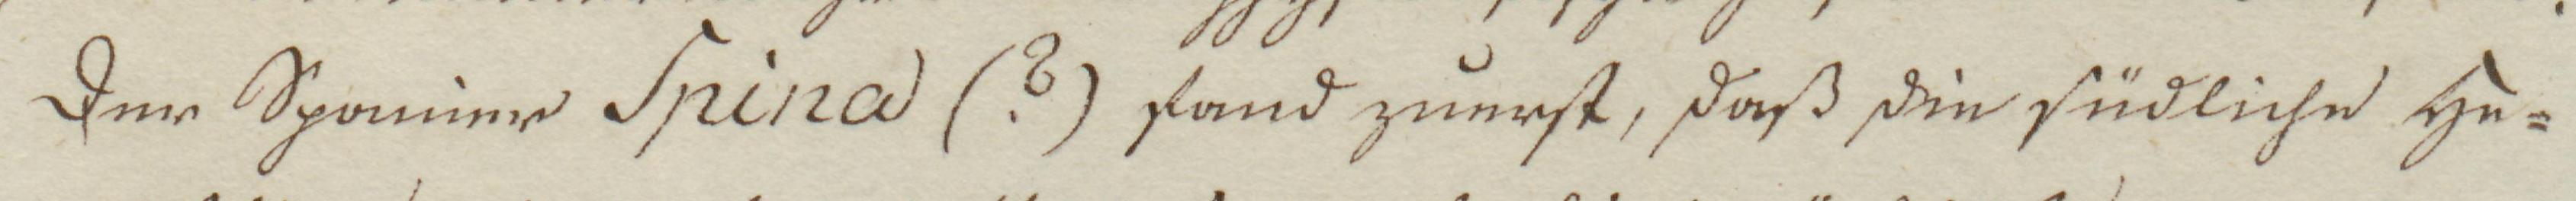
Der Spanier Spina fand zuerst, daß die südliche He-
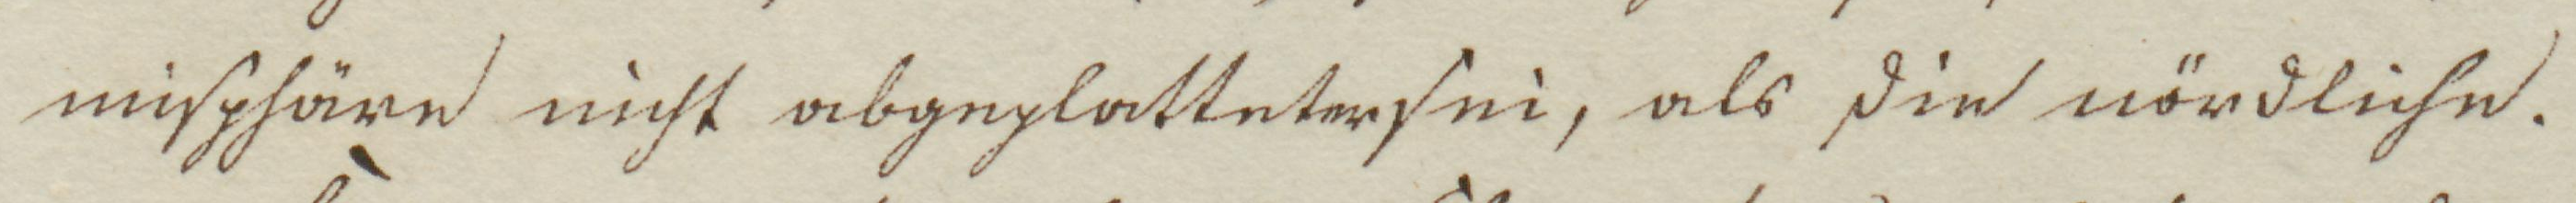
misphäre nicht abgeplatteter sei, als die nördliche.
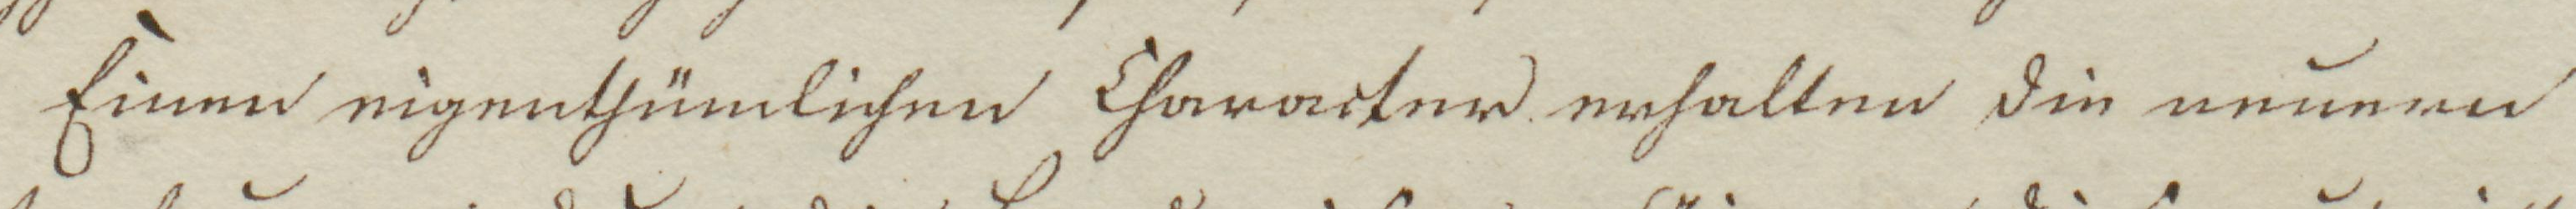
Einen eigenthümlichen Character erhalten die neuern
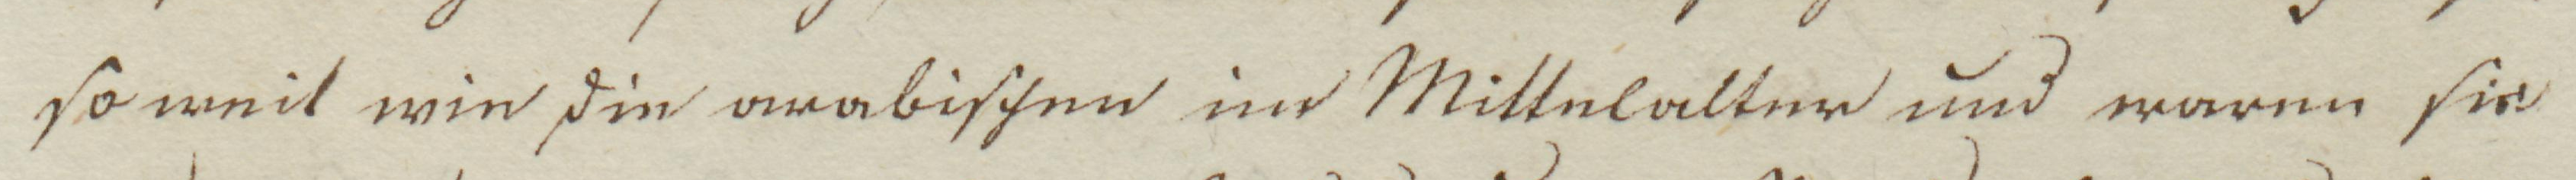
so weit wie die arabischen im Mittelalter und waren sie
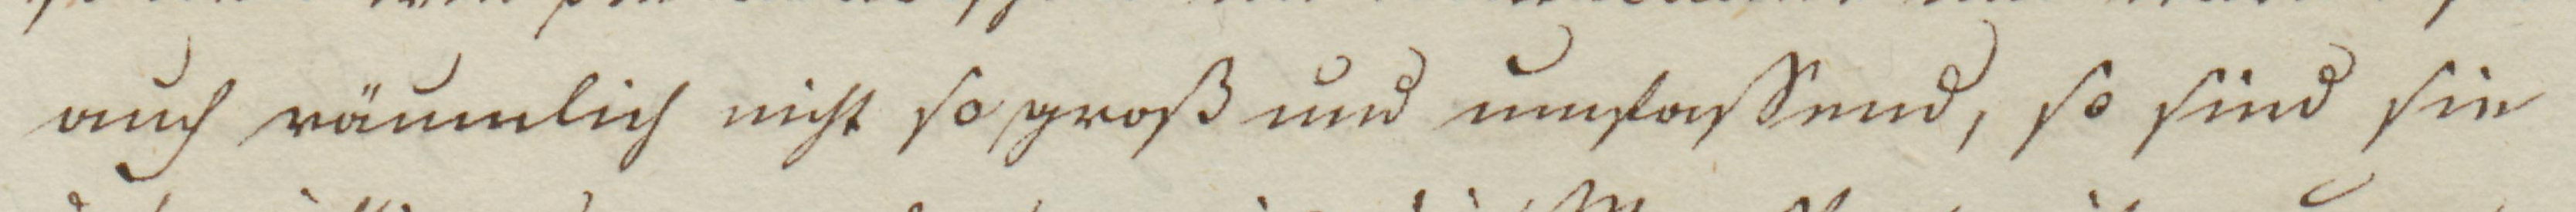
auch räumlich nicht so groß und umfassend, so sind sie
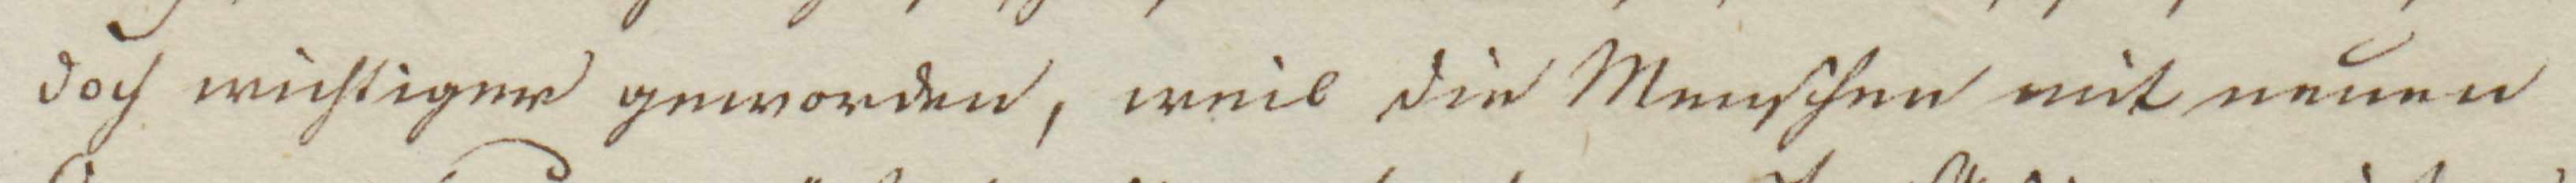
doch wichtiger geworden, weil die Menschen mit neuen
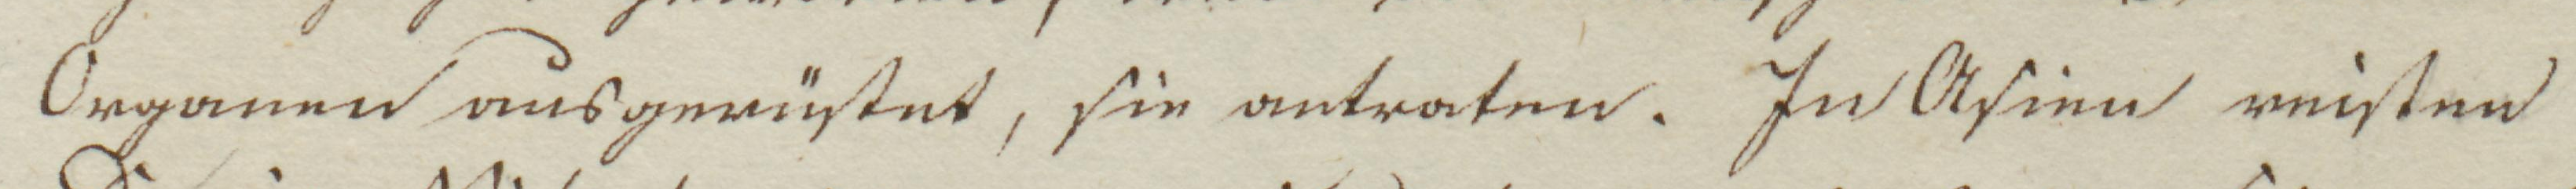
Organen ausgerüstet, sie antraten. In Asien reisten
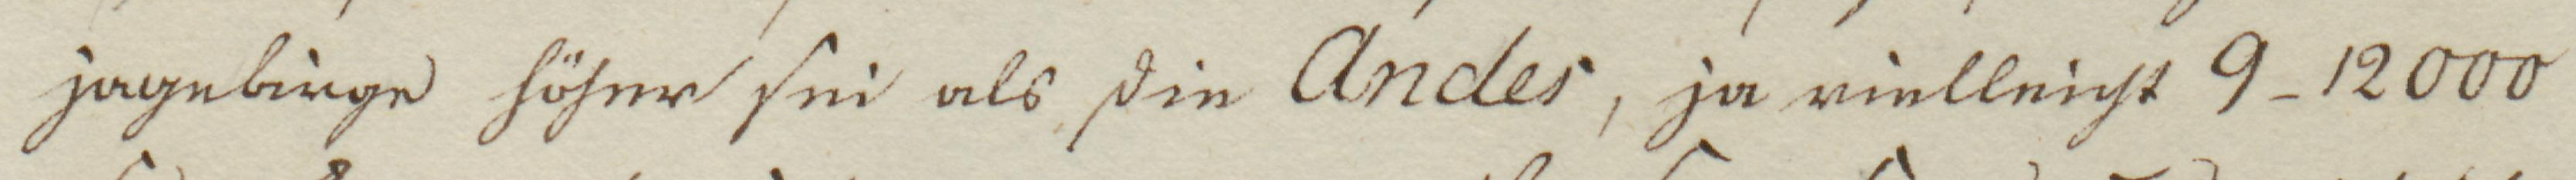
jagebirge höher sei als die Andes, ja vielleicht 9–12000
